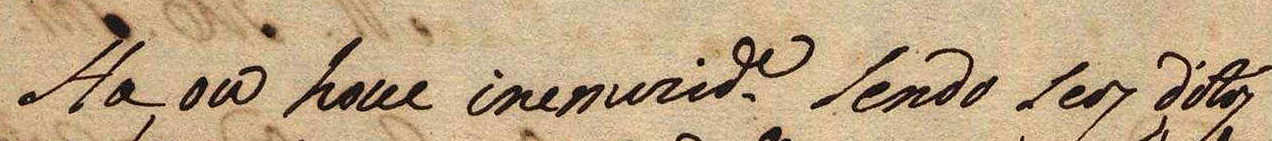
Ha, ou houe inemizid.e sendo seos ditos
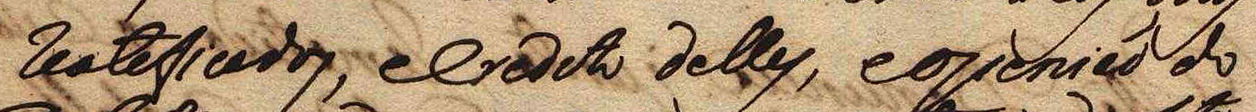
Reateficados, e Credito delles, e openiaõ do
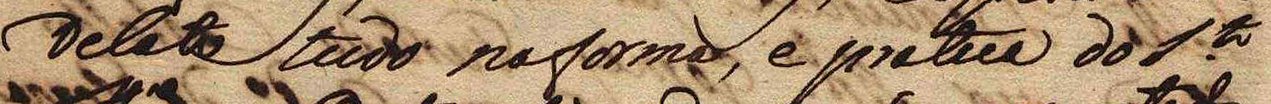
delato tudo na forma, e pratica do s.to
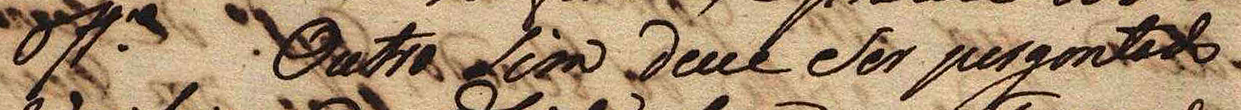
off.o Outrosim deue ser pergontado
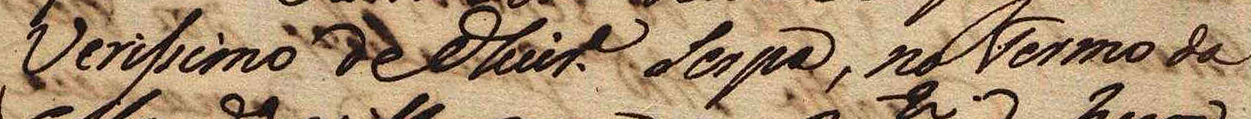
Verissimo de Oliur.a Serpa, no Termo da
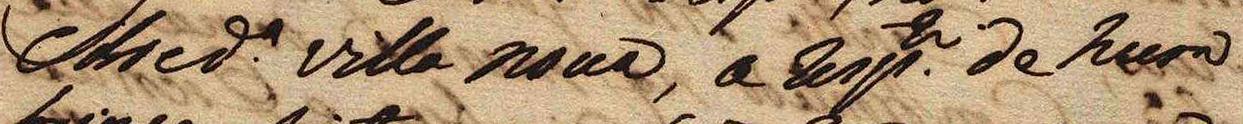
sobred.a villa noua, a Resp.to de hum
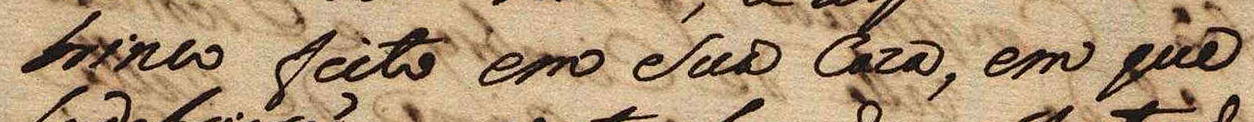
brinco feito em sua caza, em que
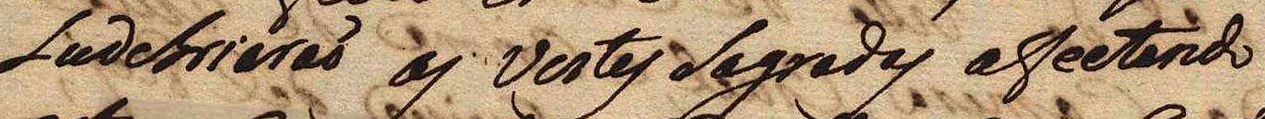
Ludebriaraõ as vestes sagradas afectando
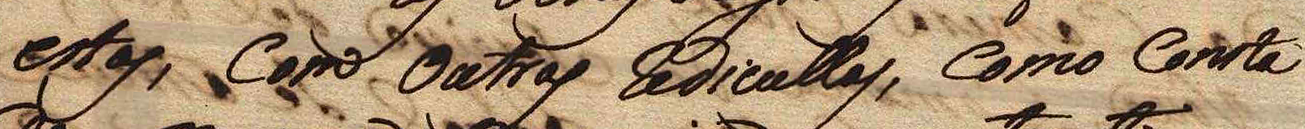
estas, com outras Redicullas, como consta
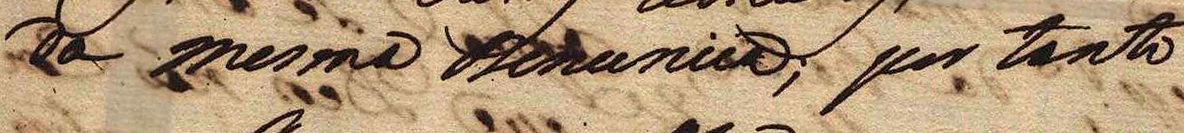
da mesma denuncia; portanto
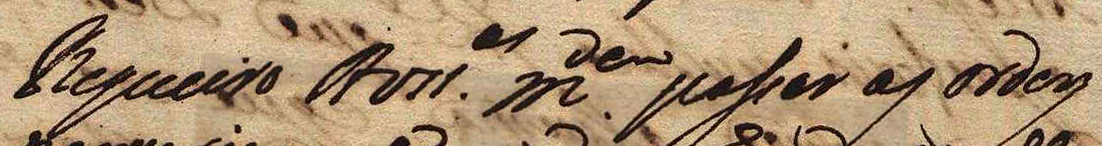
Requeiro A vss.as m.dem passar as ordens
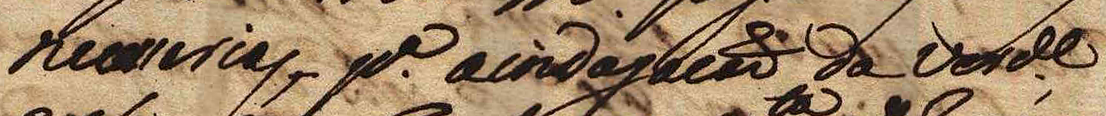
necessarias, p.a a indagaçaõ da verd.e
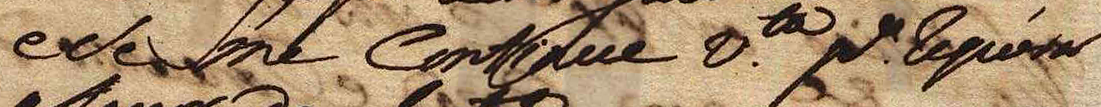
e se me Continue v.ta p.a Requerir
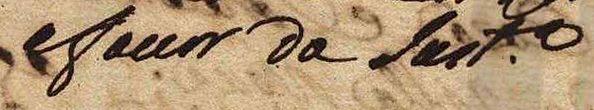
o fauor da Iust.a
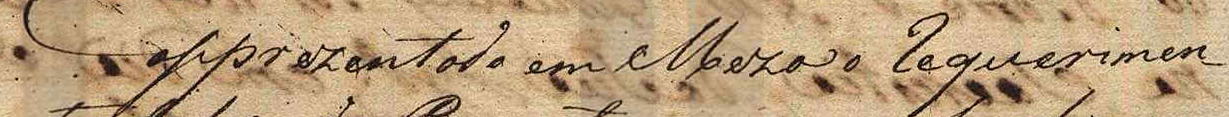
E apprezentado em Meza o Requerimen
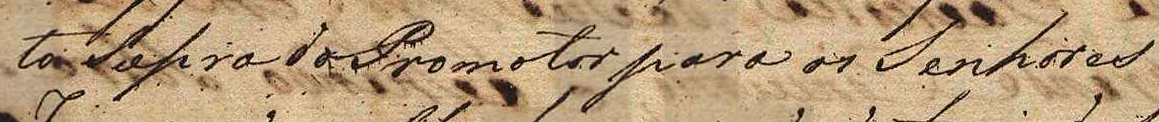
to Supra do Promotor para os Senhores
